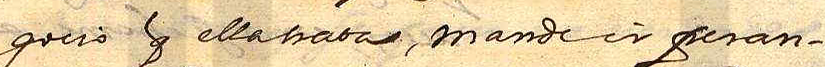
gocio q̄ ella trata, mande ir peran
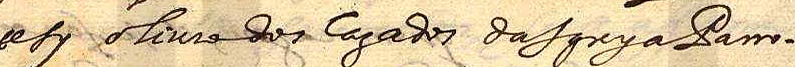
te sy o livro dos Cazados da Jgreya Parro
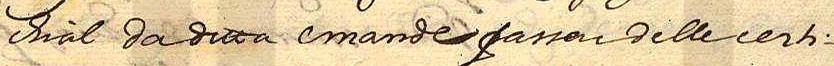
chial da ditta e mande passou delle certi
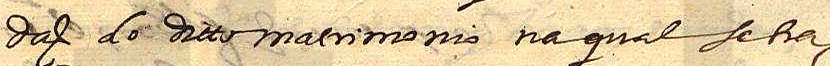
daõ do ditto matrimonio na qual se tras
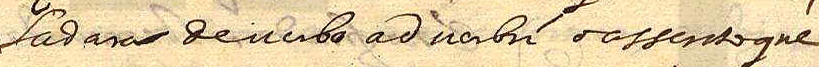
ladara de verbo ad verbū o assento que
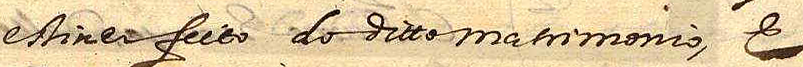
estiver feito do ditto matrimonio, E
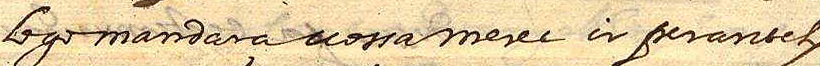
logo mandara uossa merce ir perante sy
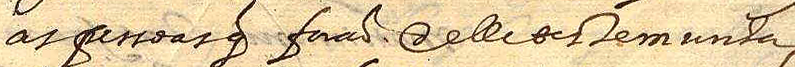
as pessoas q̄ foraõ delle testemunhas
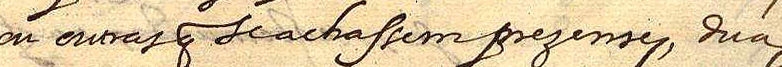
ou outras q̄ se achassem prezentes, duas
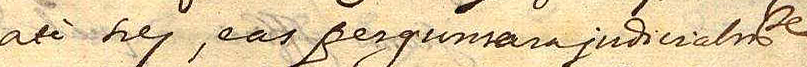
até tres, e as perguntara judicialmte
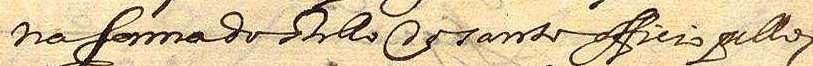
na forma do stillo do santo officio pellos
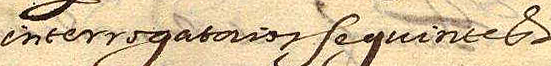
interrogatorios seguintes
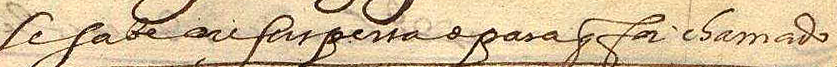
se sabe ou suspeita o para q̄ foi chamado
